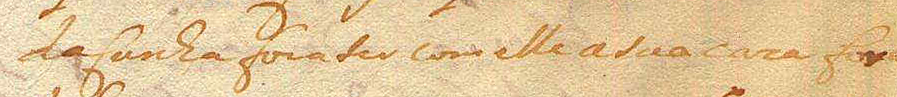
da Cunha fora ter com elle a sua caza fora
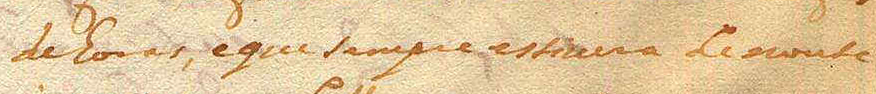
de horas, e que sempre estiuera de noute
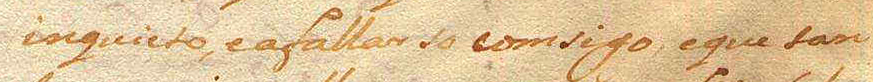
inquieto, e a fallar só comsigo, e que tan
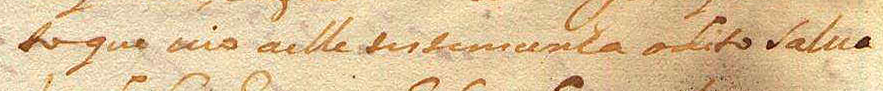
to que uio a elle testemunha o dito Salua
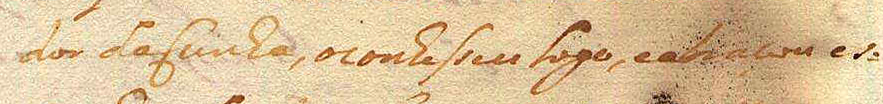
dor da Cunha, o conhesseu logo, e abraçou es
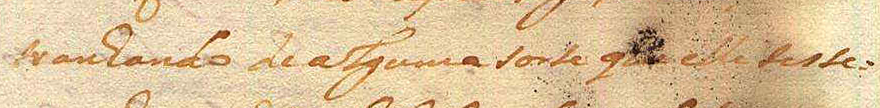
tranhando de alguma sorte q_e elle teste
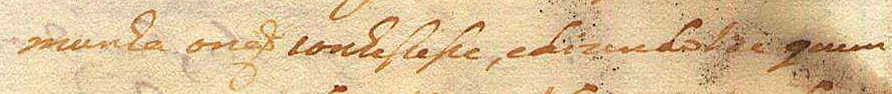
munha o naõ conhessesse, e dizendolhe quem
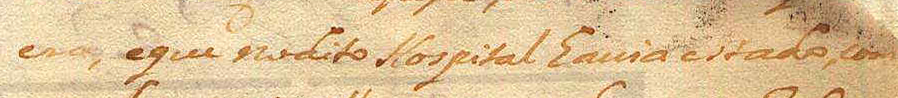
era, e que no dito Hospital hauia estado, com
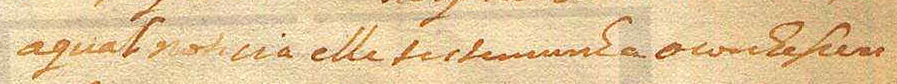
a qual noticia elle testemunha o conhesseu
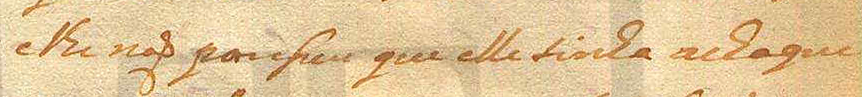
e lhe naõ paresseo que elle tinha achaque
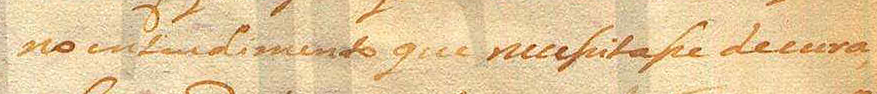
no entendimento que necessitasse de cura,
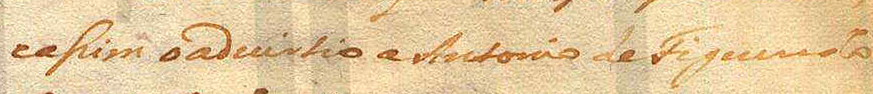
e assim o aduirtio a Antonio de Figueredo
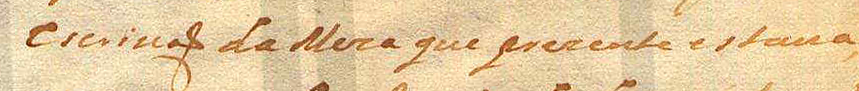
escriuaõ da Meza que prezente estaua,
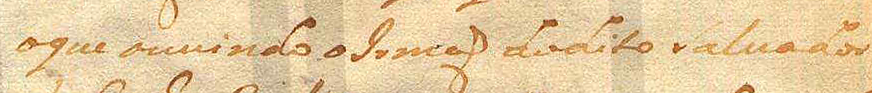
o que ouuindo o Irmaõ do dito Saluador
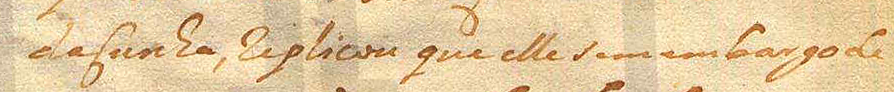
da Cunha, Replicou que elle sem embargo de
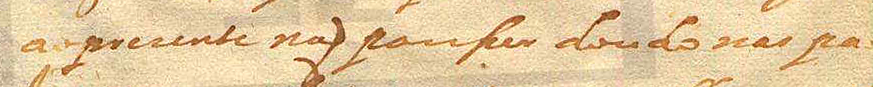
ao prezente naõ paresser doudo nas pa
